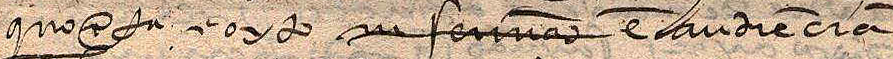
quoēta e oyto eu scriuão ē audiēciā
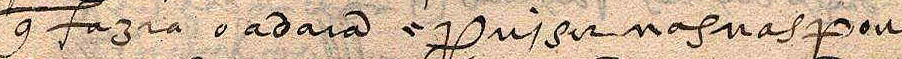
q̄ fazia o adaiā e ꝓujsor na suas pou
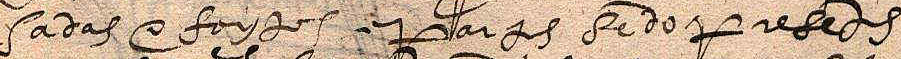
sadas e feytos e partes sēdo presētes
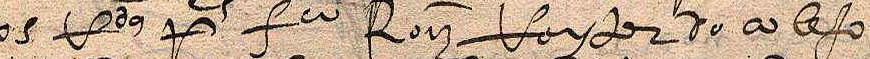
os Rdꝯ pes fco Roīz Reytor do coleJo
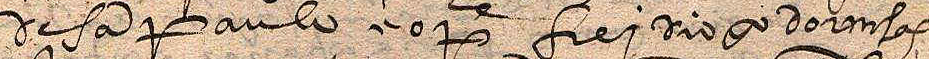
de sā paulo e o pe frej diogo dornelas
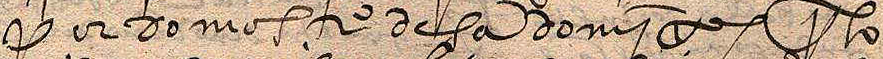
pior do mostro de sā domj̄gos p̄lo
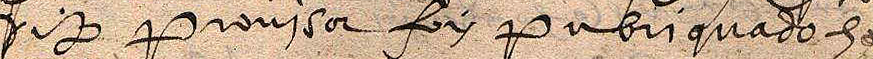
dito proujsor foy pubriquado ho
